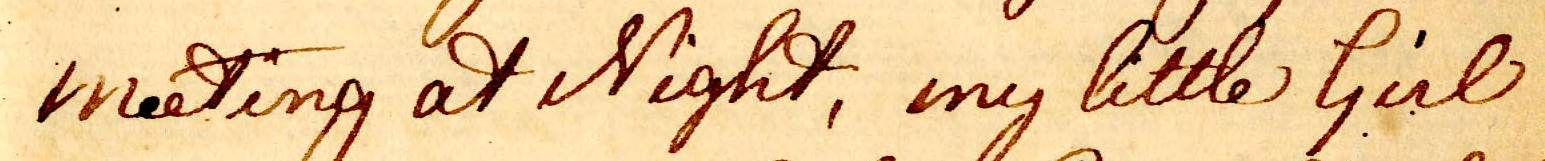Meeting at Night, my little Girl
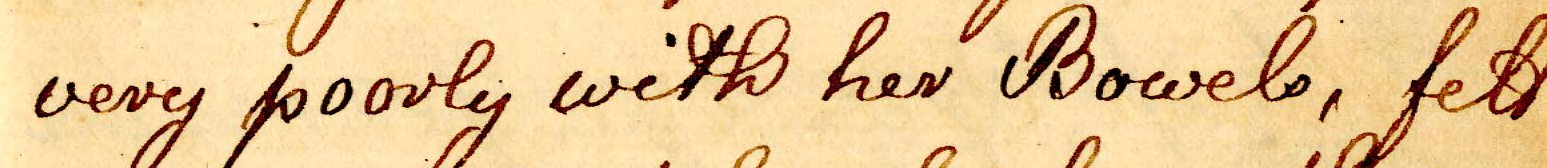very poorly with her Bowels, felt
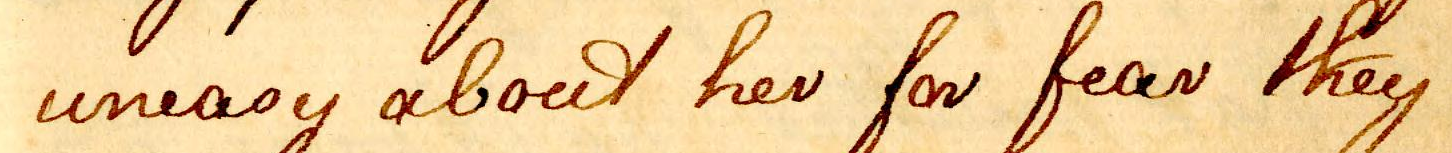uneasy about her for fear they
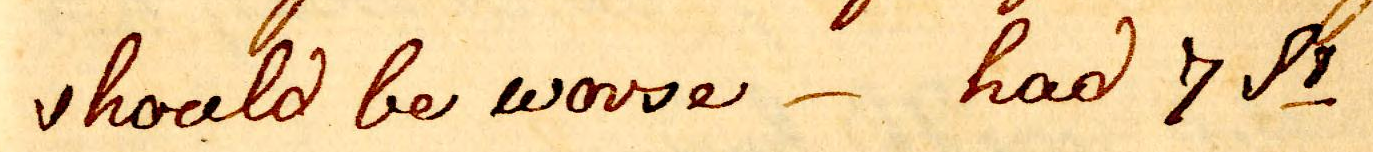should be worse- had 7 S^t
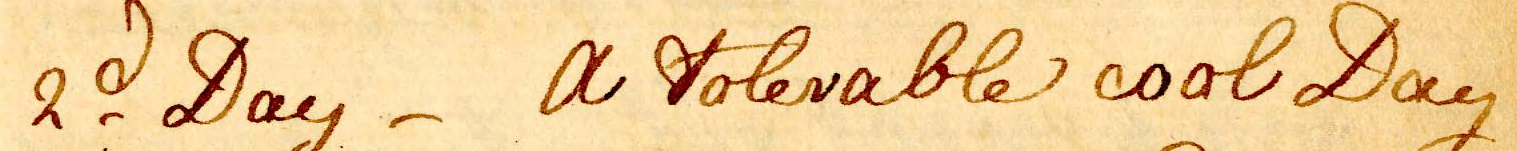2^d- Day- A tolerable cool Day
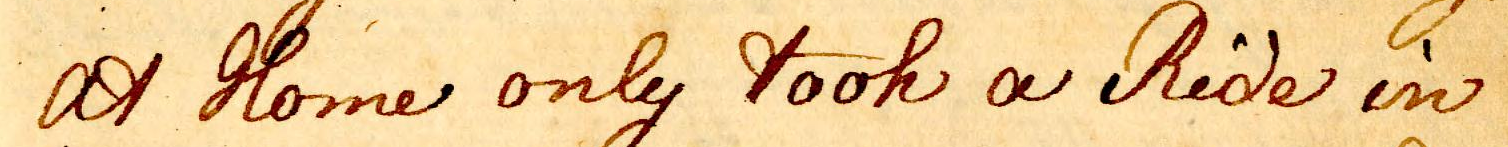At Home only took a Ride in
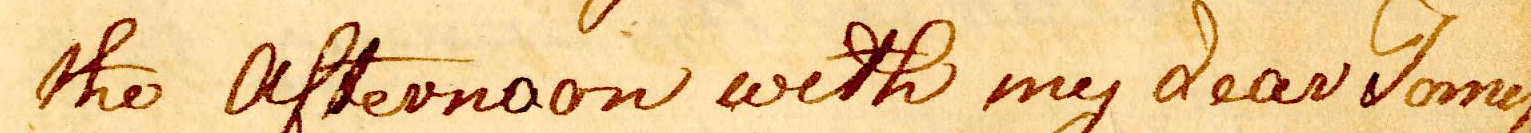the Afternoon with my dear Tomy
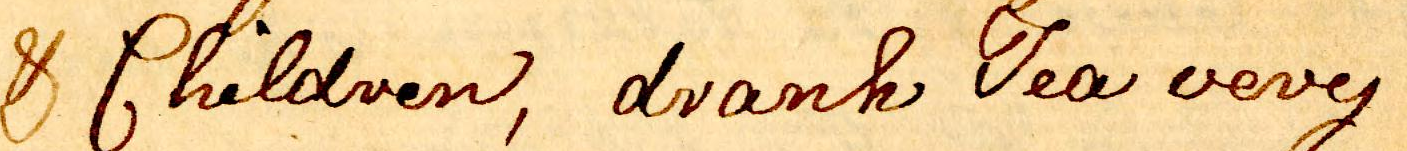& Children, drank Tea very
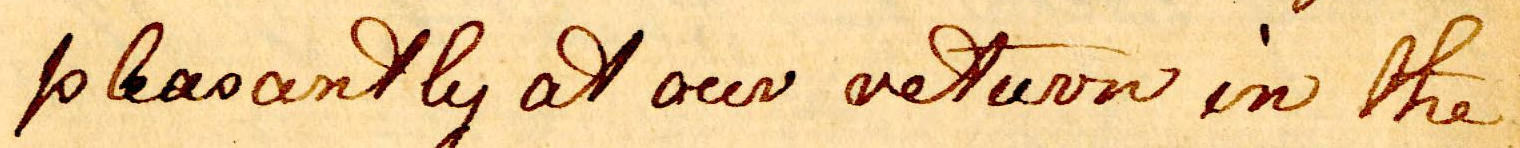pleasantly at our return in the
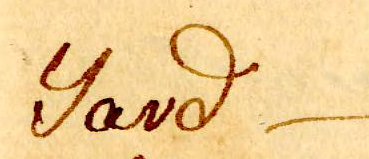Yard
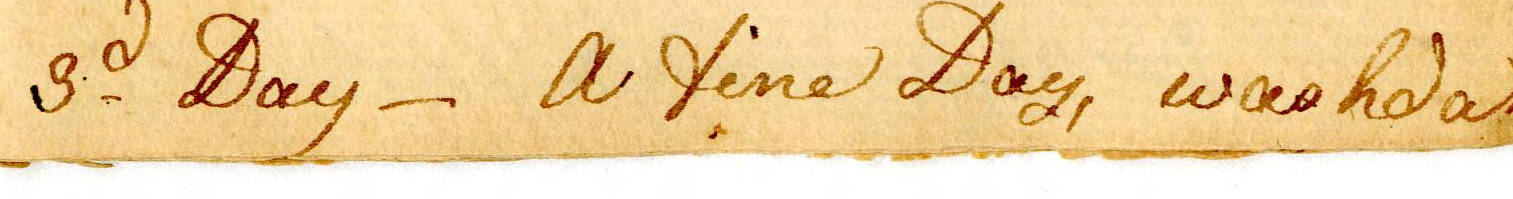3^d Day- A fine Day, washd at
